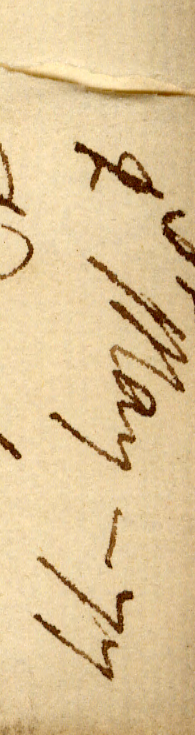1^st May -77
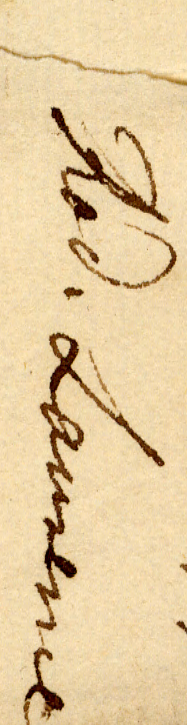Rod. Lawrence
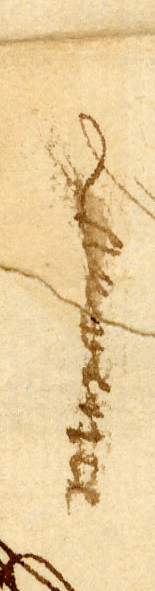Lawrence
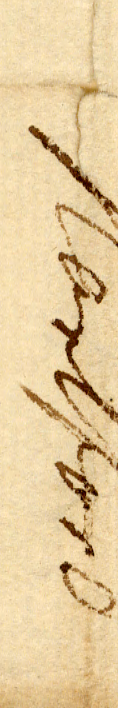Hartford
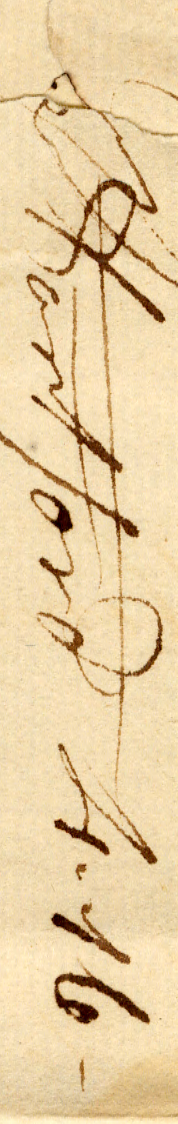Hartford 4.16-
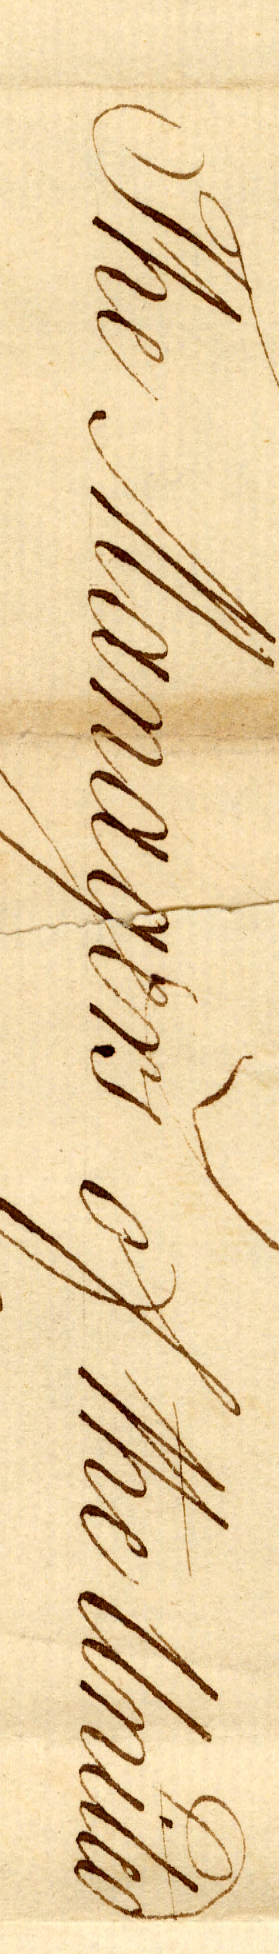The Managers of the United
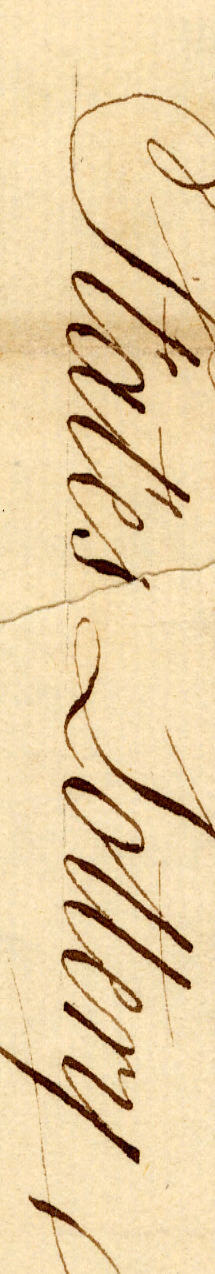States Lottery
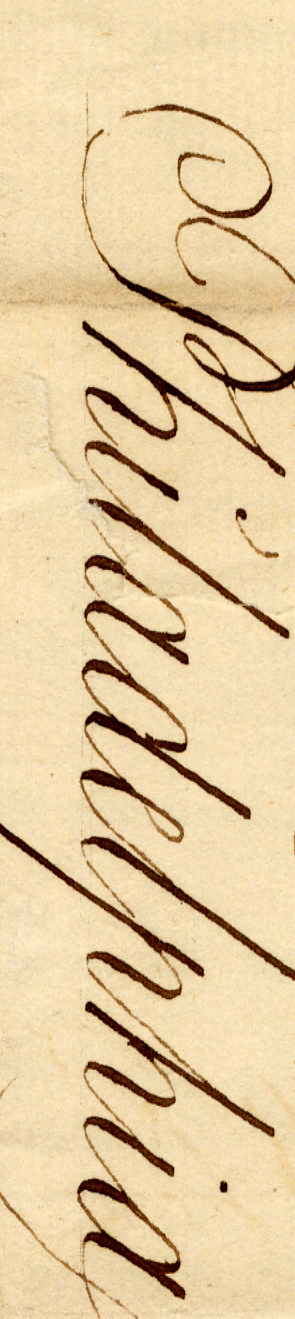Philadelphia
